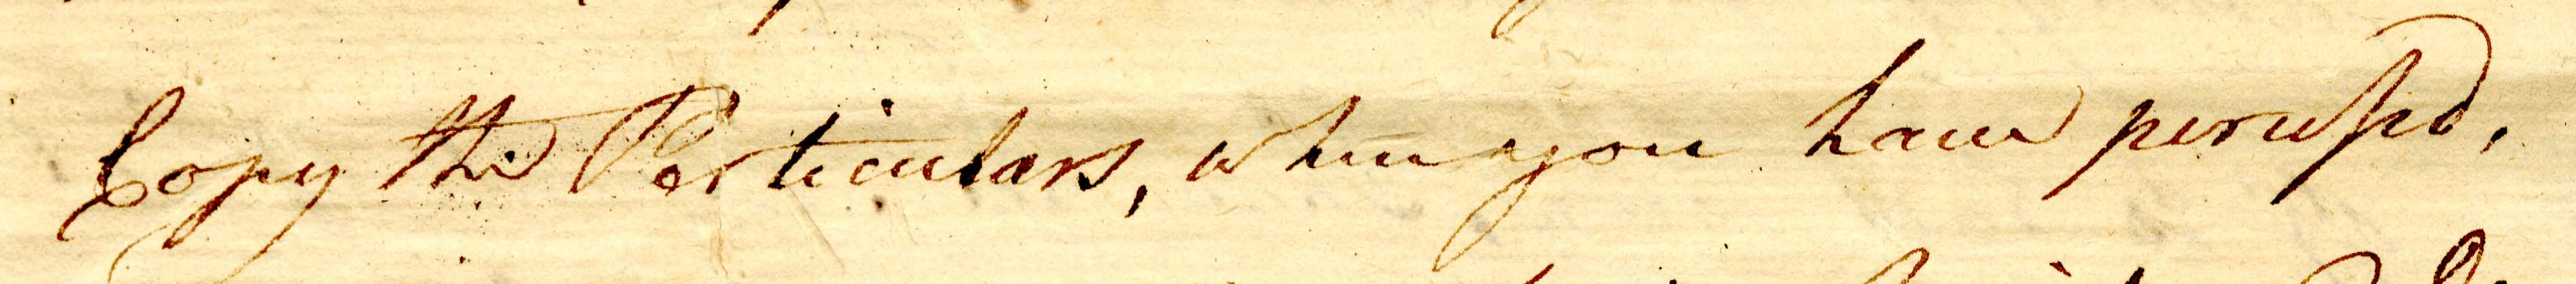Copy the Particulars, when you have perused,
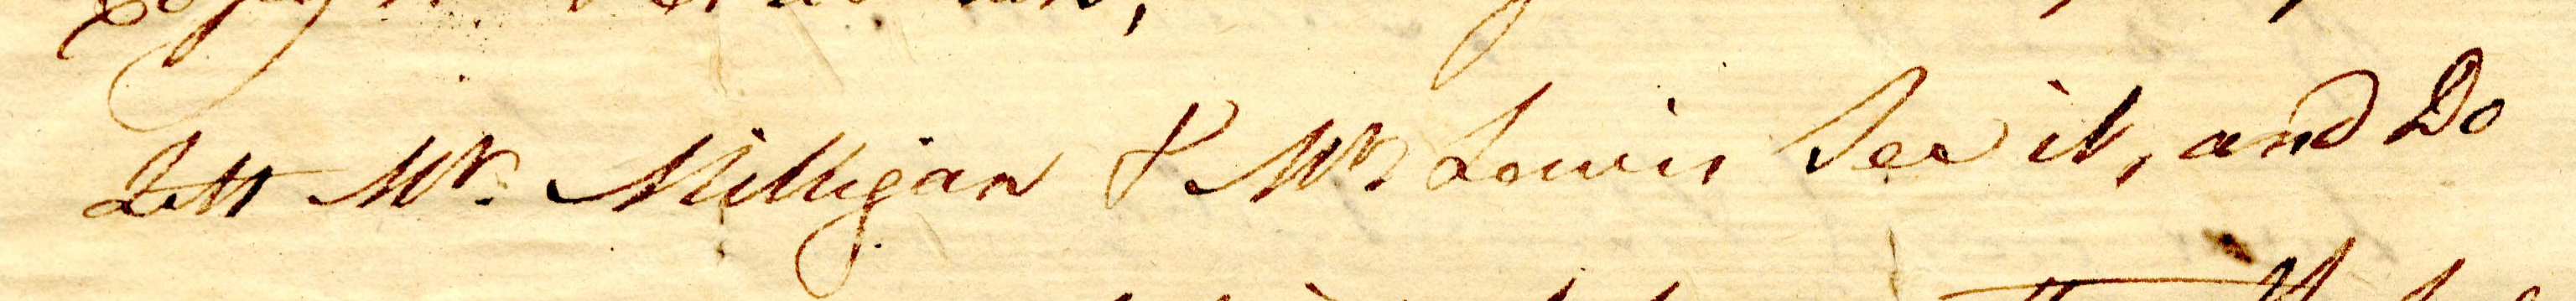Lett M^r. Milligan & M^r. Lewis See it, and Do
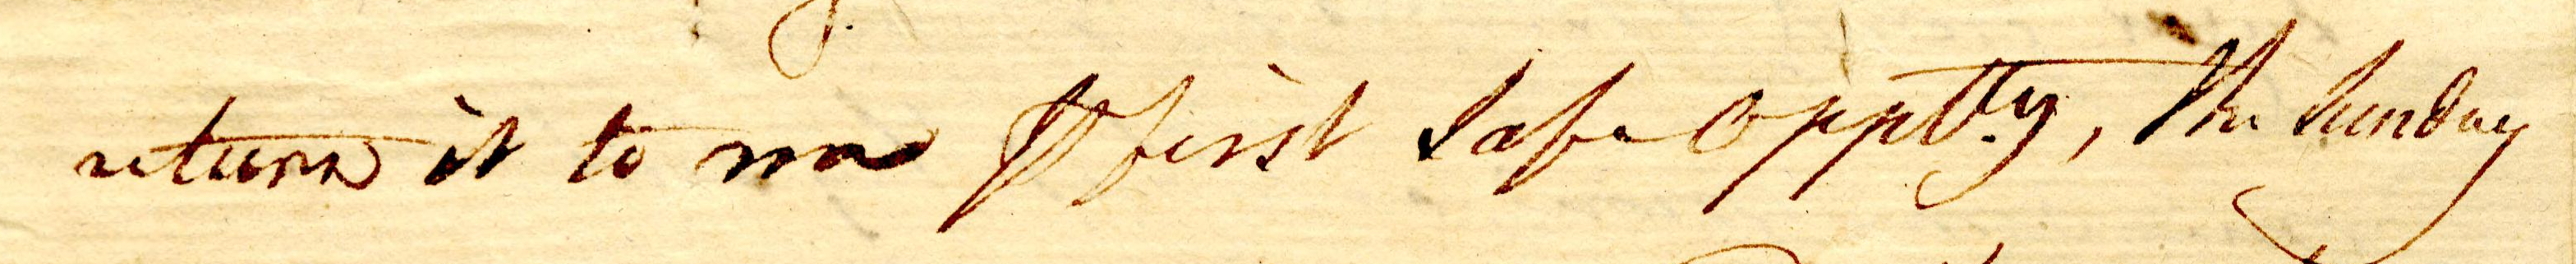return it to me per first safe oppt^ty., the Sunday
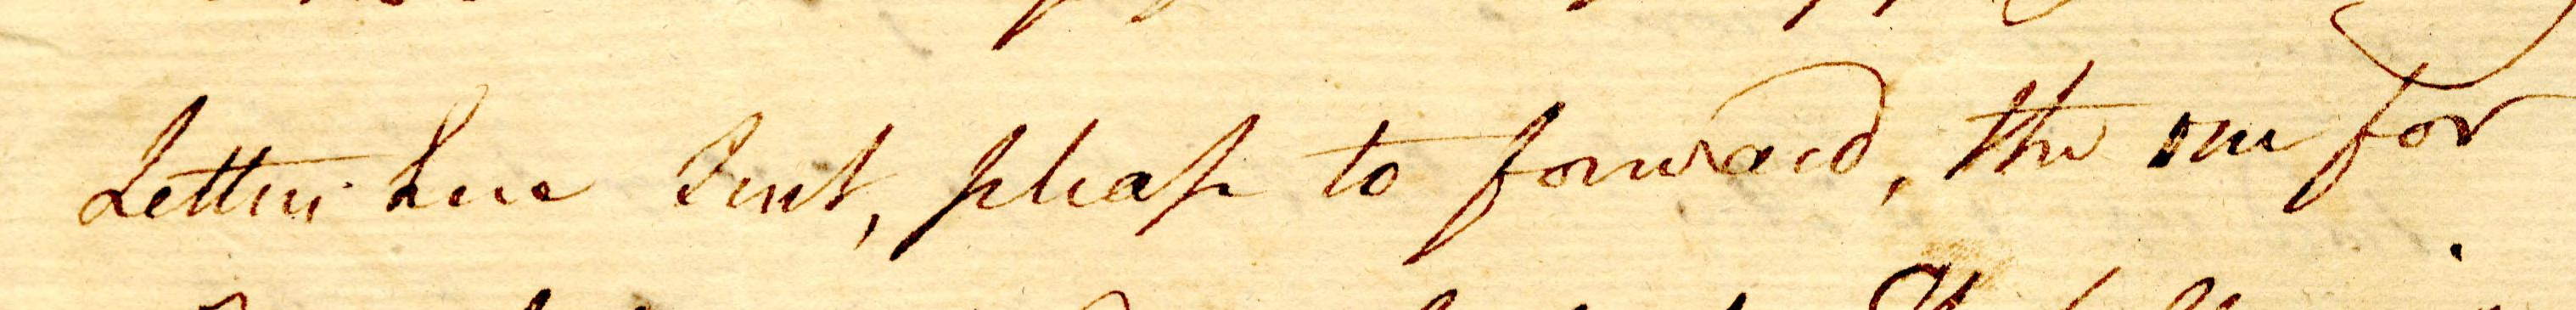letter here sent, please to forward, the one for
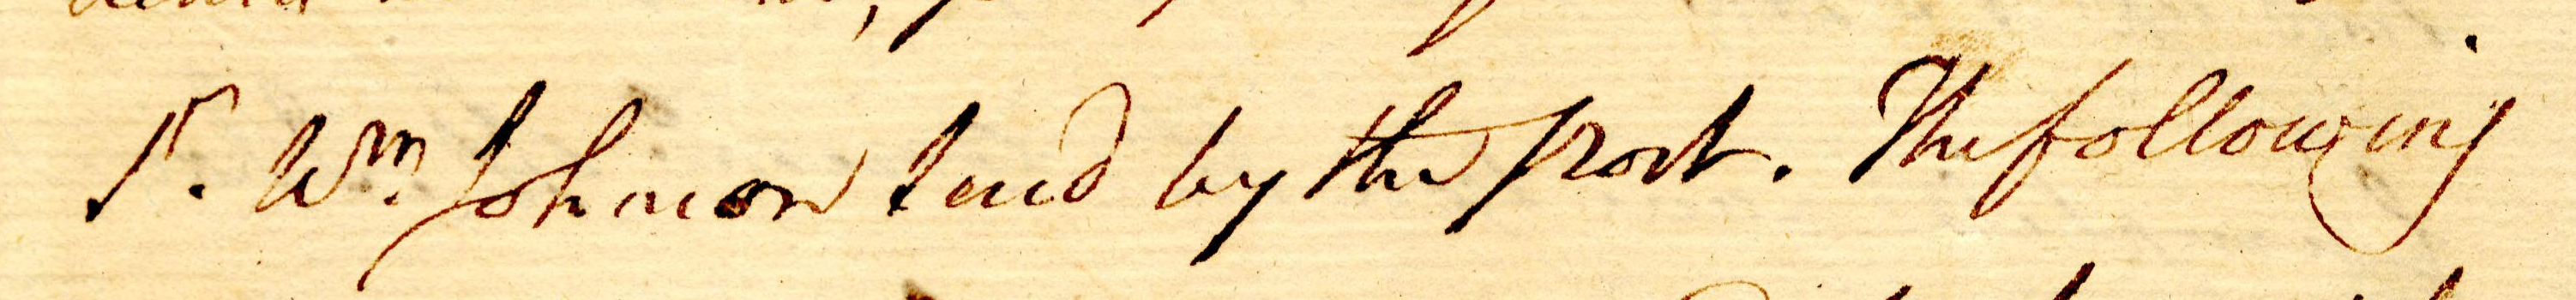S^r. W^m. Johnson reced by the port. The following
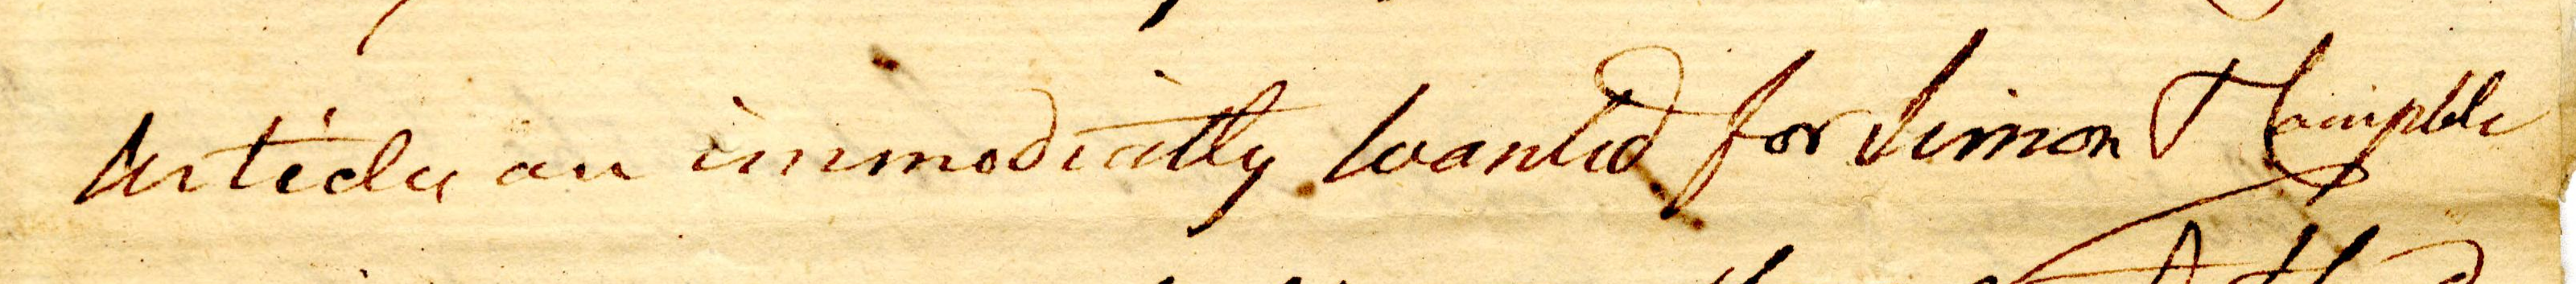Articles are immediatly wanted for Simon & Campble
